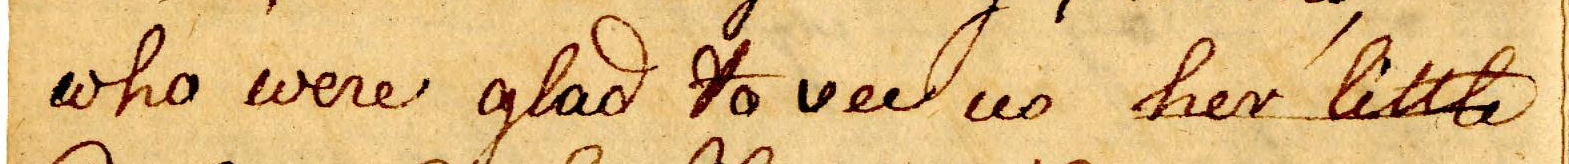who were glad to see us her little
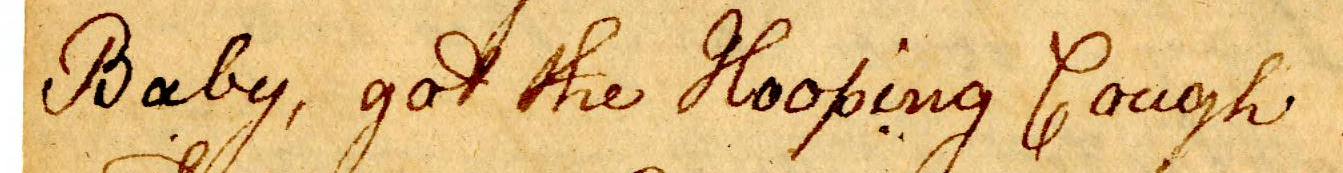Baby, got the Hooping Cough
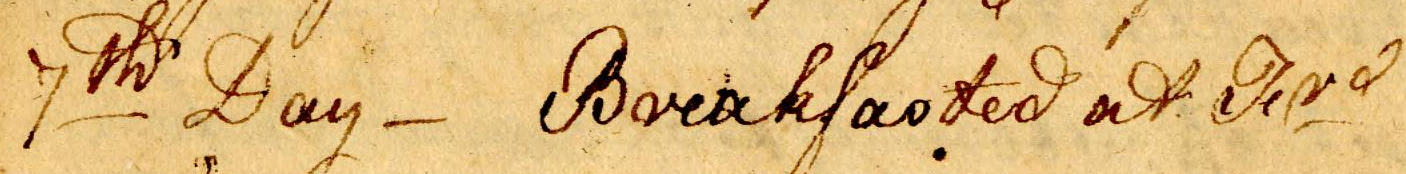7^th Day- Breakfasted at F^rd
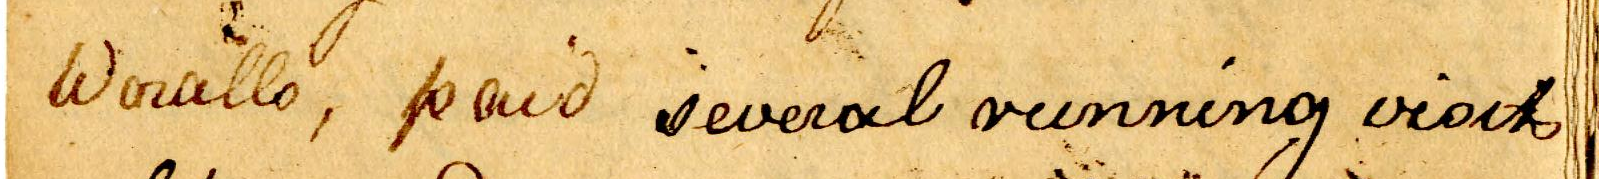Woralls, paid several running visits
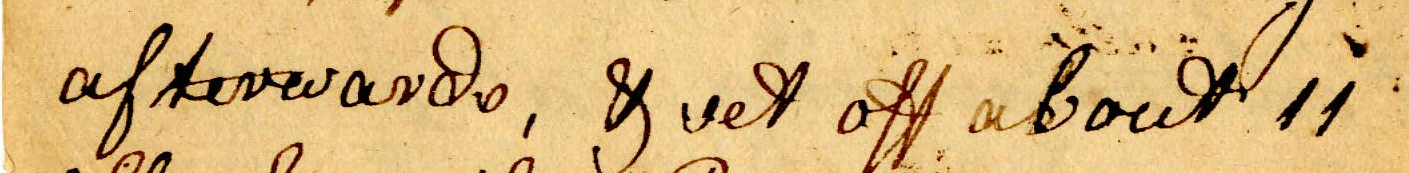afterwards, & set off about 11
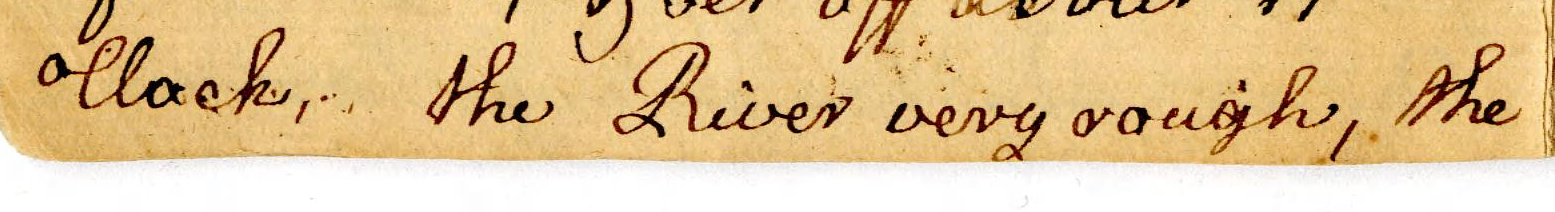^oClock, the River very rough, the
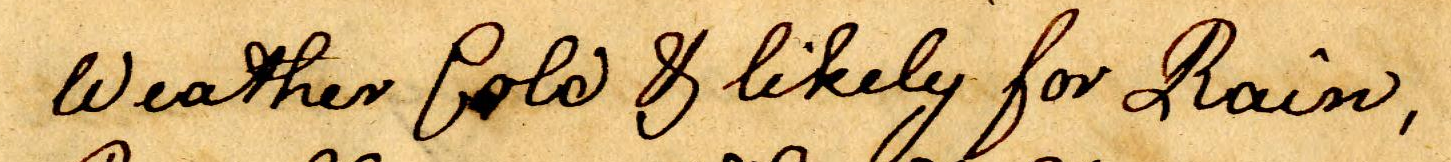Weather Cold & likely for Rain,
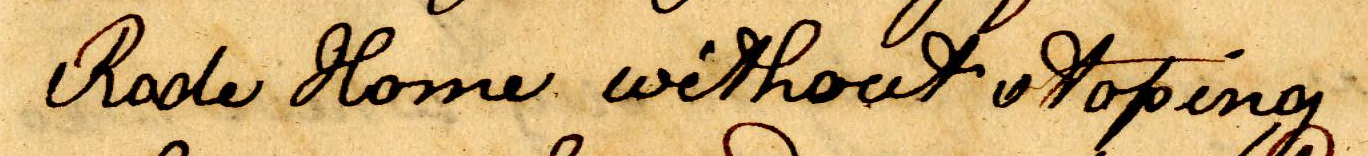Rode Home without stoping
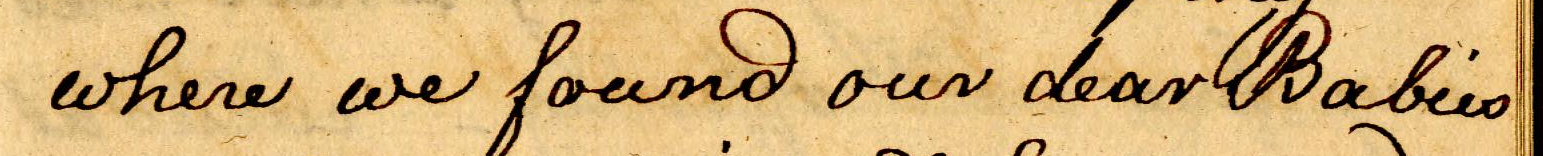where we found our dear Babies
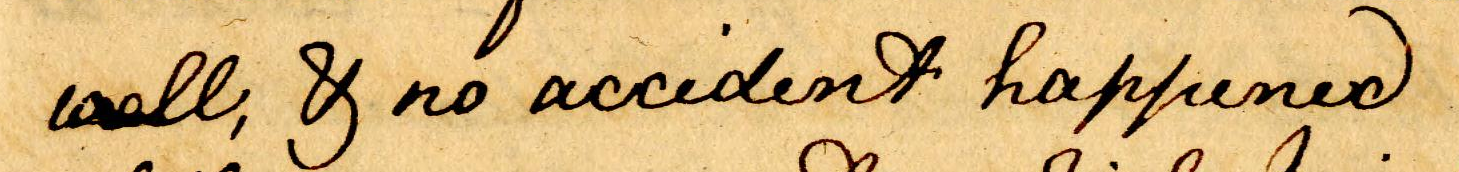well, & no accident happened
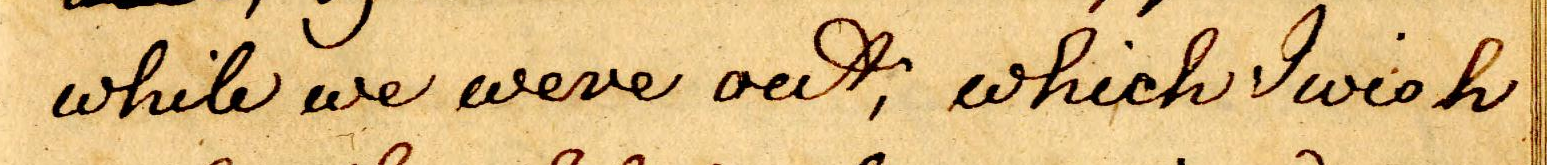while we were out, which I wish
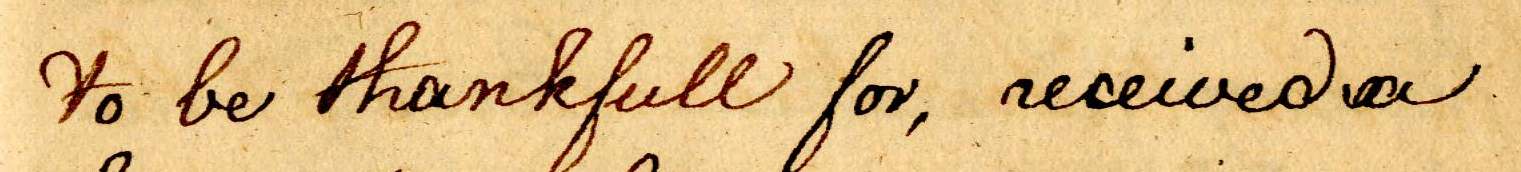to be thankfull for, received a
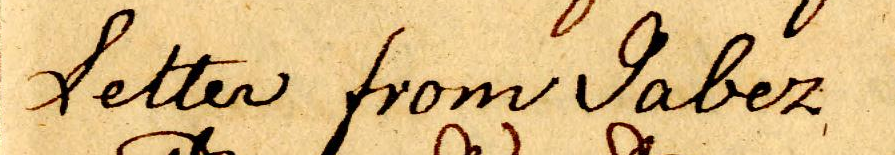Letter from Jabez
